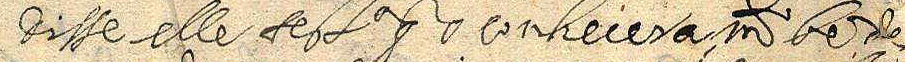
disse elle testa q̄ o conhecera mto bē de
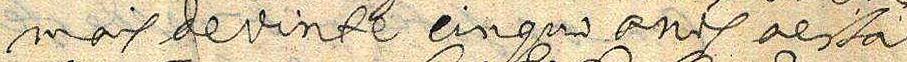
mais de vinte cinquo anos a esta
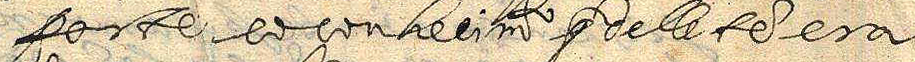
parte e o conhecimto q̄ delle tē era
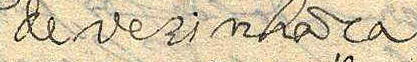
de vezinhāça
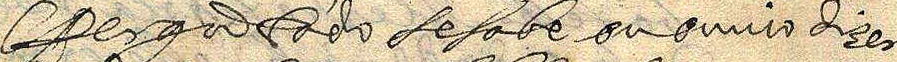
e pergūtado se sabe ou ouuio dizer
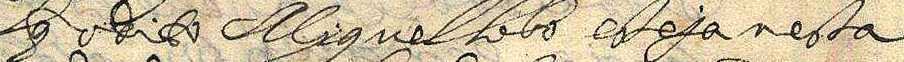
q̄ o dito Miguel lobo esteja nesta
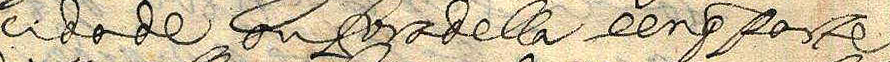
cidade ou fora della e en q̄ parte
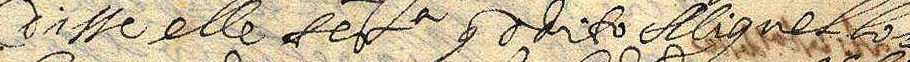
disse elle testa q̄ o dito MigueL lo
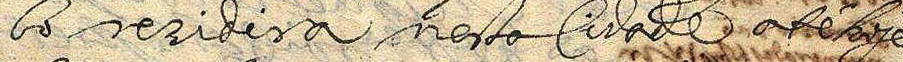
bo rezidira nesta Cidade até hoje
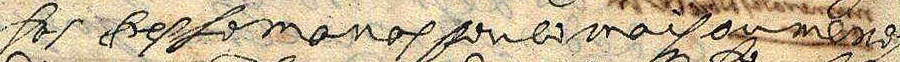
fas tres somanas pouco mais ou menos
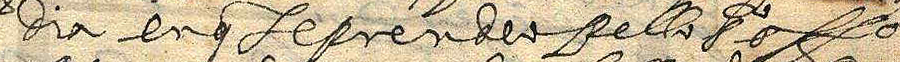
dia en q̄ se prendeo pello sto offo
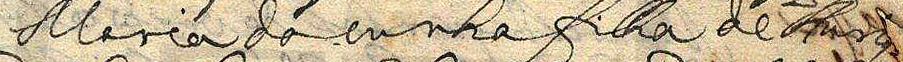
Maria da cunha filha de Anri_e
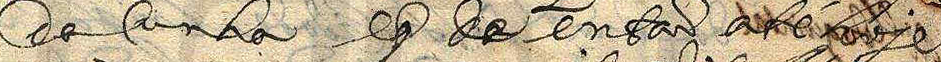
da Cunha e q̄ de entaõ até hoje
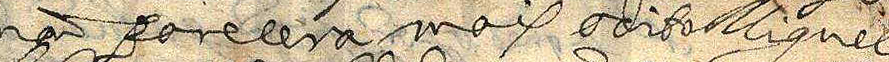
não parecera mais o dito Miguel
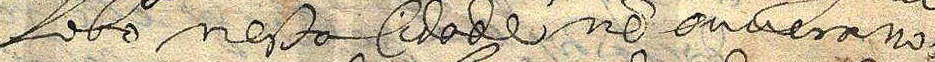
Lobo nesta Cidade nē ouuera no
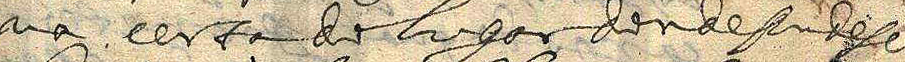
ua certa do lugar donde pudese
